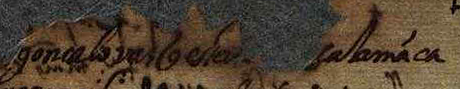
gonçalo vas q̄ estev _ salamāca
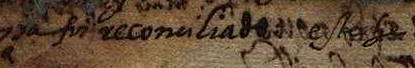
ja foi reconciliado. este he
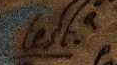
test.a
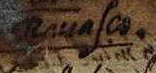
Rauasco.
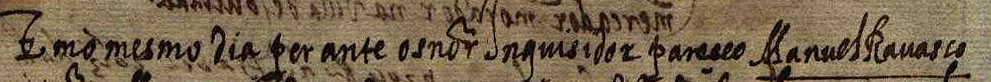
Em o mesmo dia perante o snōr Inquisidor pareceo Manuel Rauasco
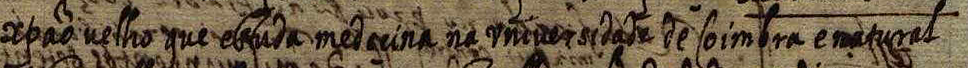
xpaõ uelho que estuda medecina na Vniuersidade de Coimbra e natural
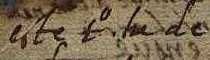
este to. he de
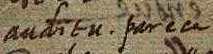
auditu. parece
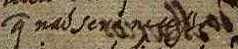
q̄ naõ sera necessa
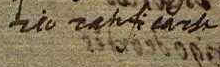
rio ratificarse
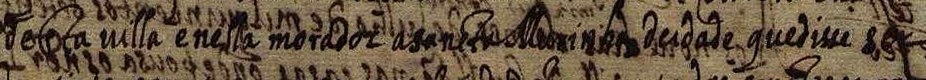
desta uilla e nella morador a sancta Marinha de idade que disse ser
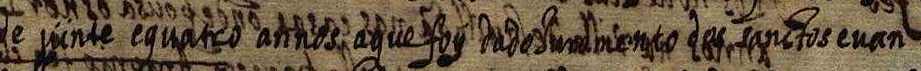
de uinte e quatro annos a que foy dado Iuramento dos sanctos euan
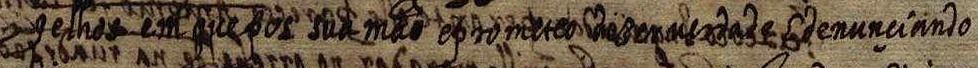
gelhos em que pos sua mão e prometeo dizer uerdade E denunciando
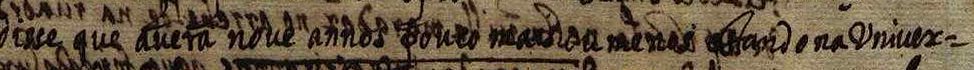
disse que auera noue annos pouco mais ou menos estando na Vniuer
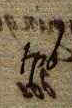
tpo
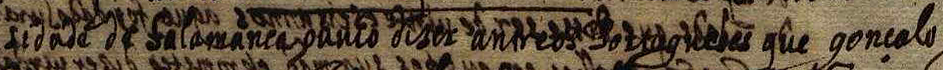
sidade de Salamanca ouuio dizer antre os Portugueses que gonçalo
